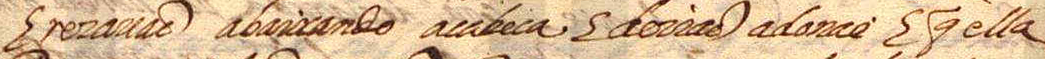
E rezauaõ abaixando a cabeca E deziaõ adonai E q̄ ella
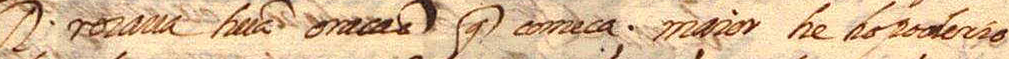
R. rezaua huā oracaõ q̄ comeca. maior he ho poderio
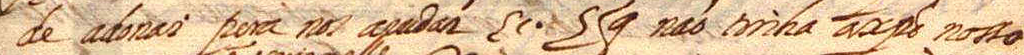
de adonai pera nos aiudar Ec. E q̄ naõ tinha a xpō nosso
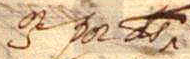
sor por d̄s.
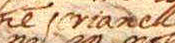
nē cria nelle
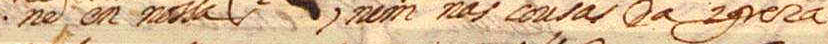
nē en nossa sra, nem nas cousas da igreia
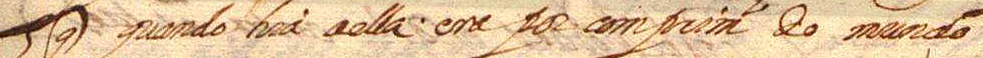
E q̄ quando hia a ella. era por comprimto do mundo
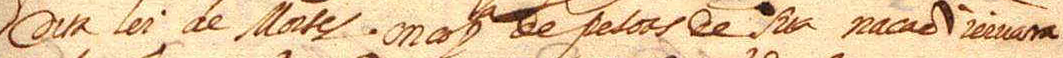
dita lei de Moises. en copa de pesoas de sua nacaõ ieiuara
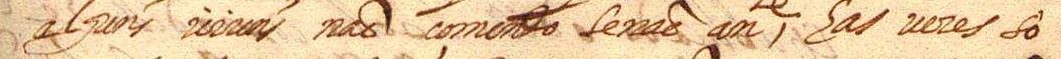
alguns̄ ieiuns̄ naõ comendo senaõ a nte, E as uezes só.
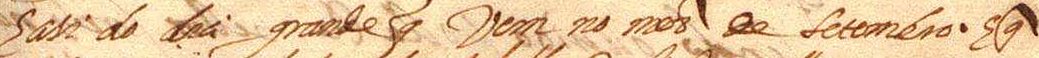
E asi do dia grande q̄ Vem no mez̄ de setembro. E q̄
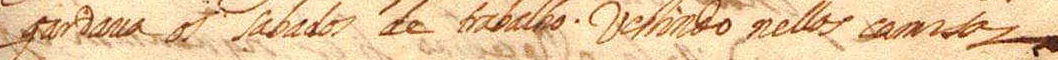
gardaua os sabados de trabalho. Vestindo nellas camisas
